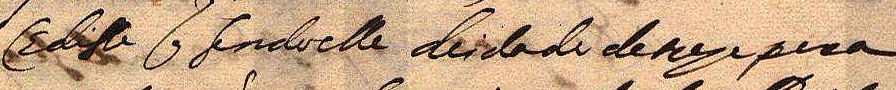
(E disse q̄ sendo elle de idade de treze pera
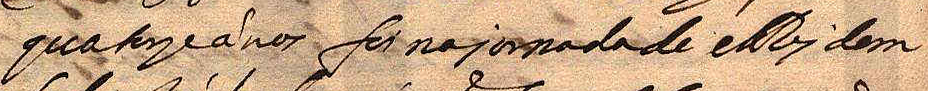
quatorze an̄os foi na jornada de el Rej dom
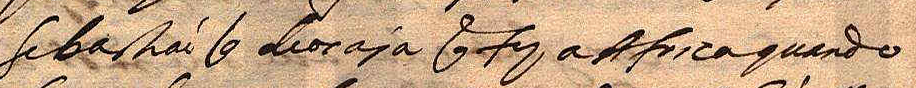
sebastiaõ q̄ deos aja q̄ fez a Africa quando
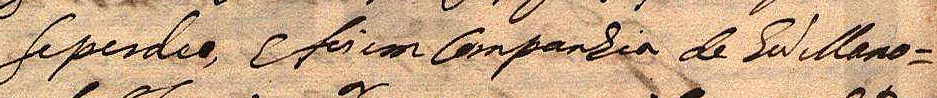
se perdeo, E foi em Companhia de hū Mano
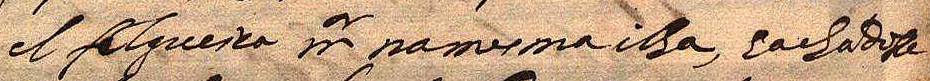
el felgueira m.or na mesma ilha, E achadosse
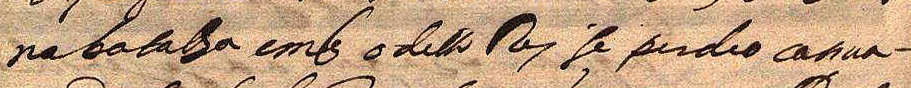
na batalha em q̄ o ditto Rej se perdeo catiua
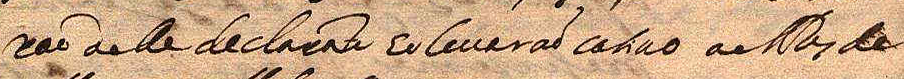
raõ delle declarāte E o leuaraõ catiuo a el Rey de
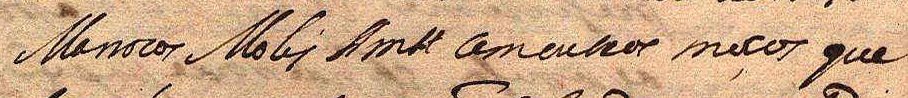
Marrocos Molej Amet com outros moços que
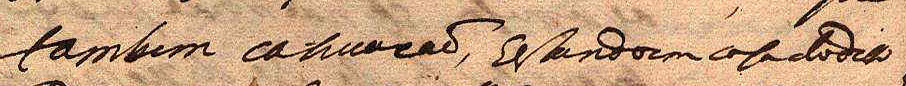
tambem catiuaraõ, E estando em casa do ditto
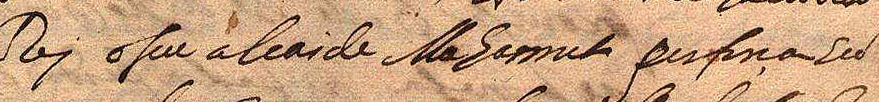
Rej o seu alcaide Mohamet per força E cō
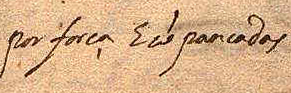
por força E cō pancadas
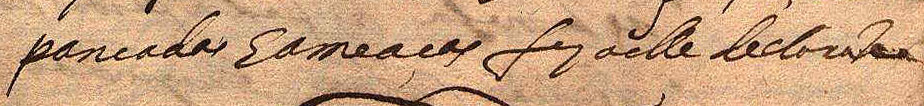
pancadas E ameaças fez a elle declarāte
